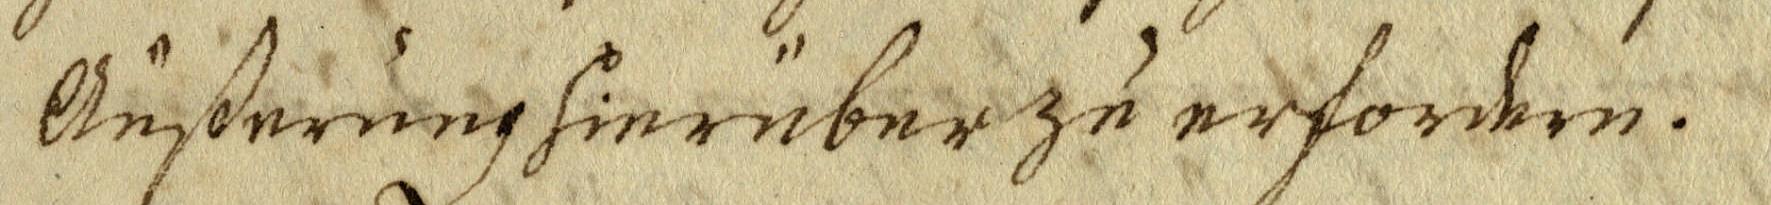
Äußerung hierüber zu erfordern.
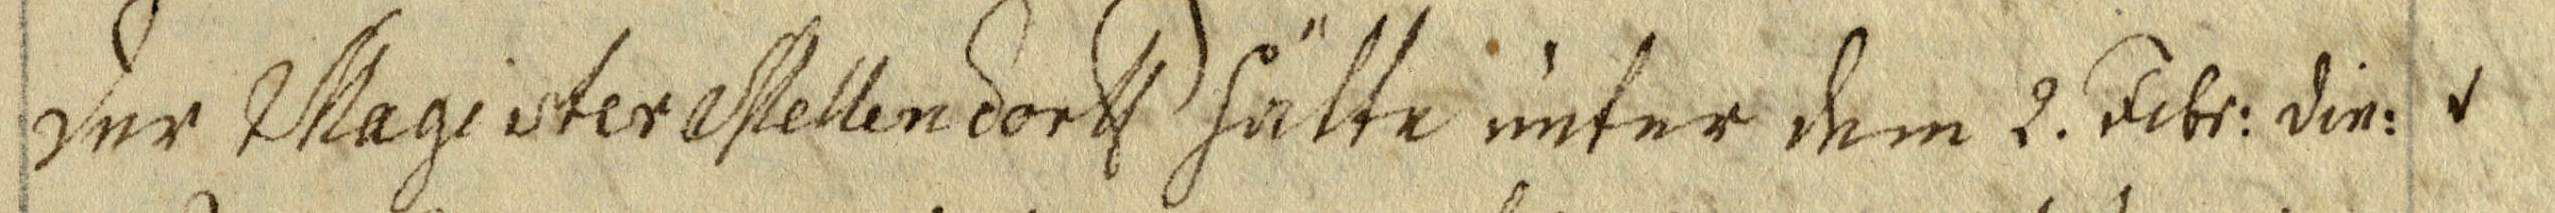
Der Magister Mellendorff hätte unter dem 2. Febr. die¬
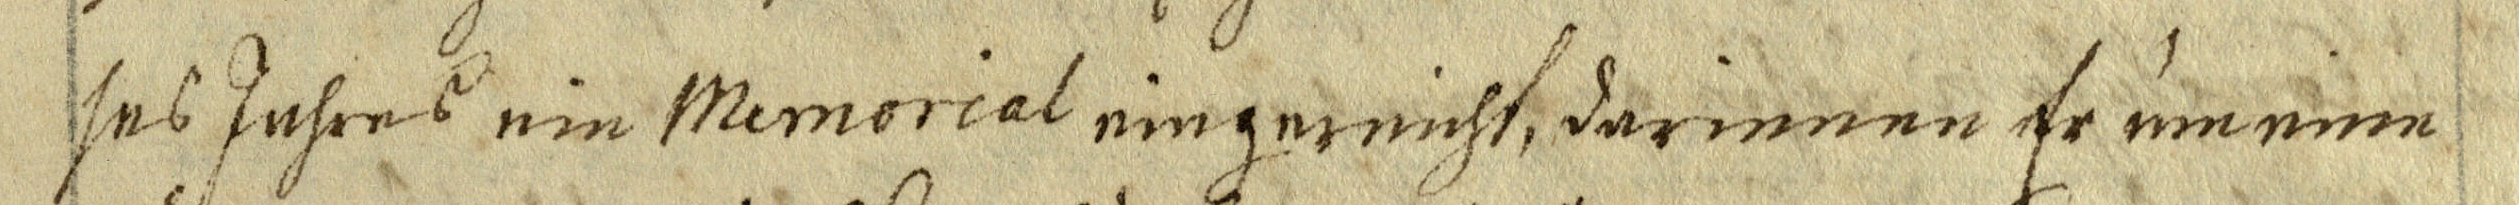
ses Jahres ein Memorial eingereicht, darinnen Er um eine
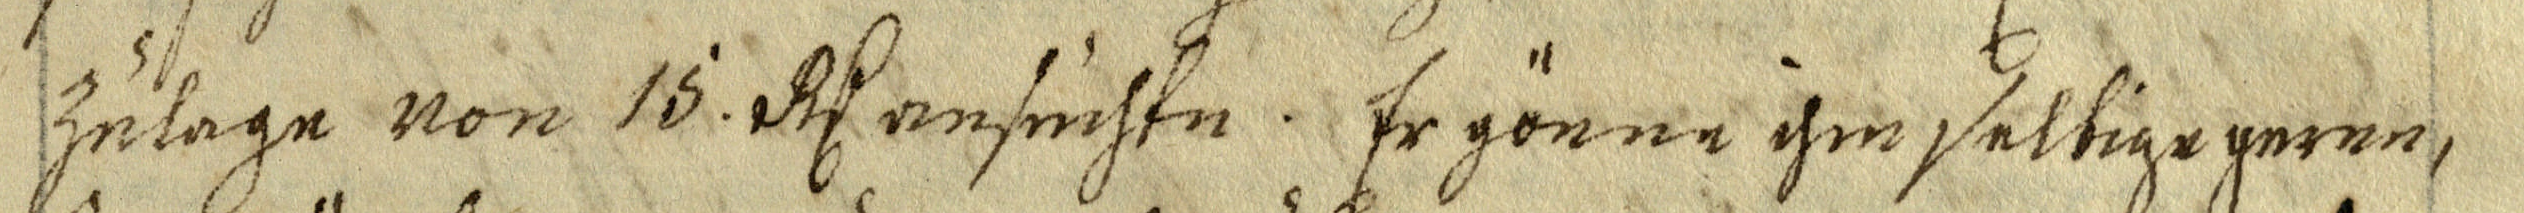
Zulage von 15 Rt ansuchte. Er gönne ihm selbige gerne,
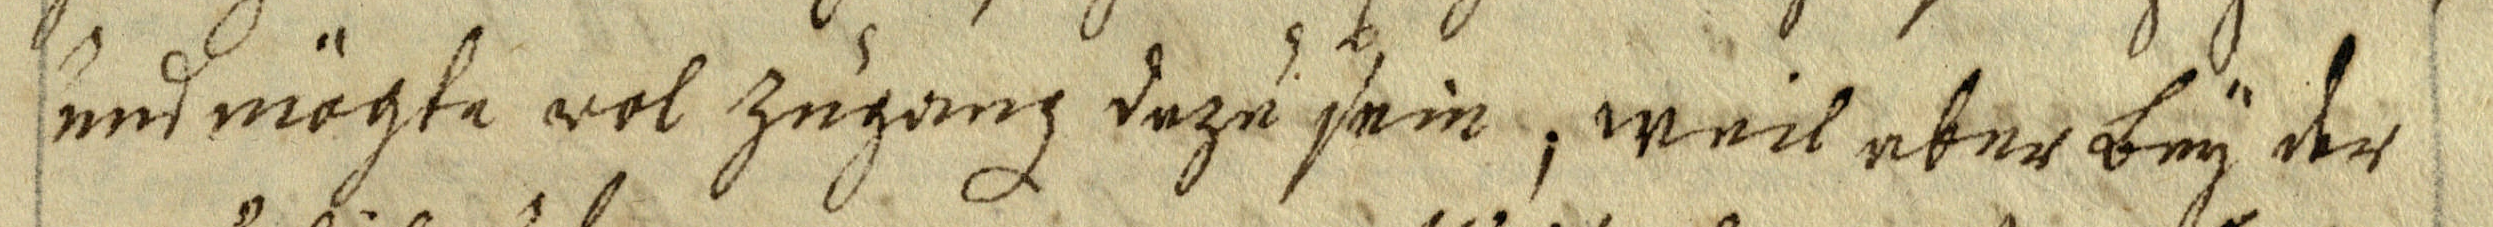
und mögte wol Zugang dazu sein, weil aber beÿ der
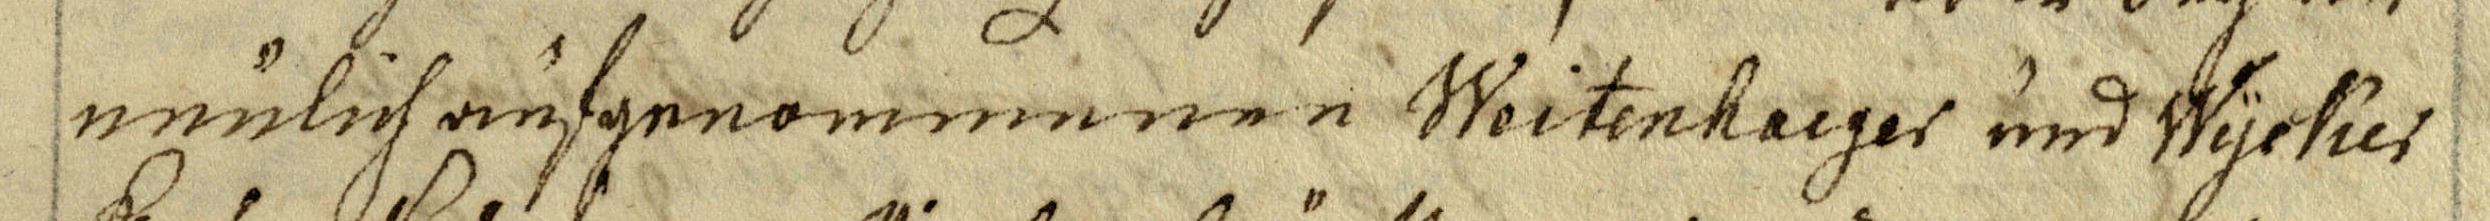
neulich aufgenommenen Weitenhaeger und Wÿcker
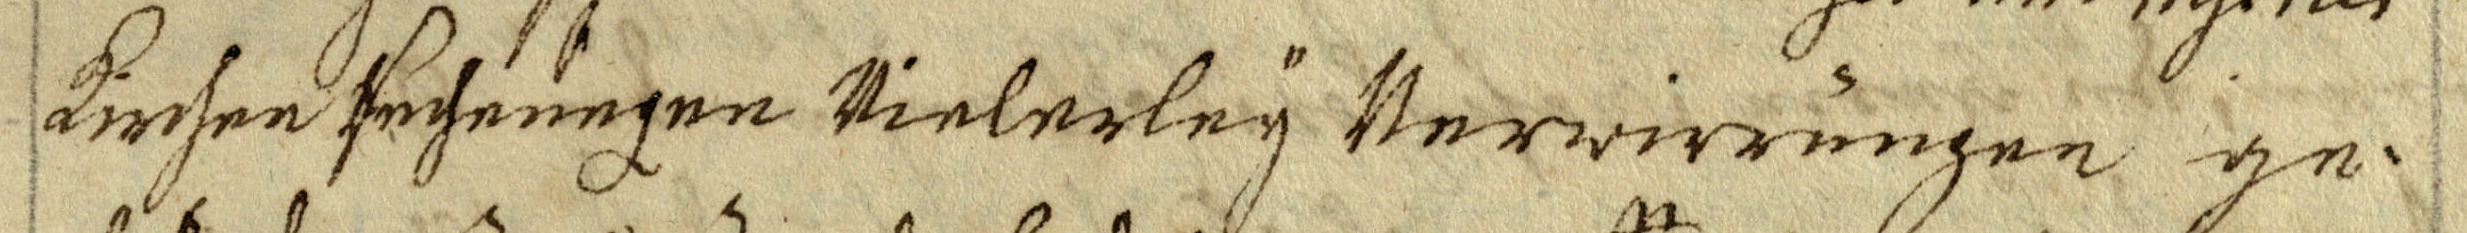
Kirchen Rechnungen vielerleÿ Verwirrungen ge¬
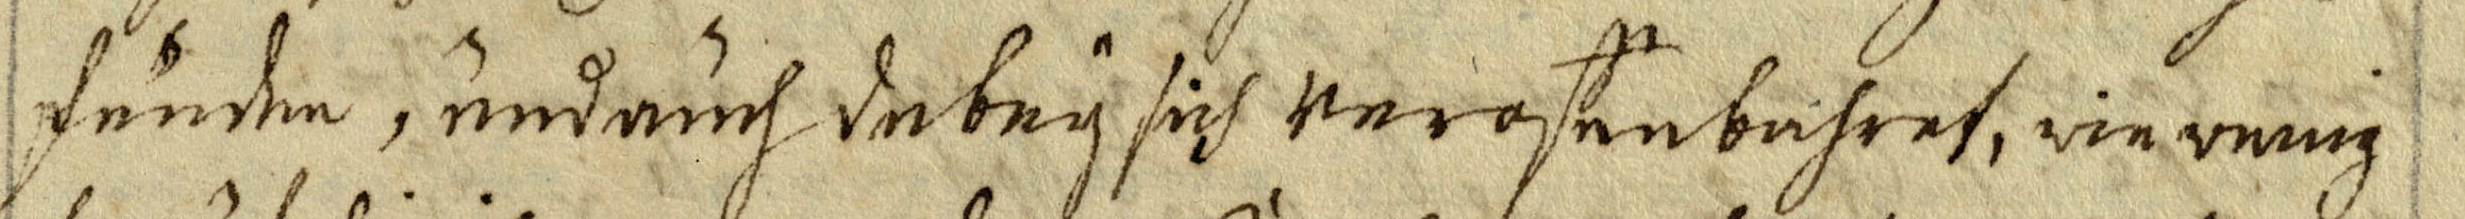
fungen, und auch dabeÿ sich veroffenbahret, wie wenig
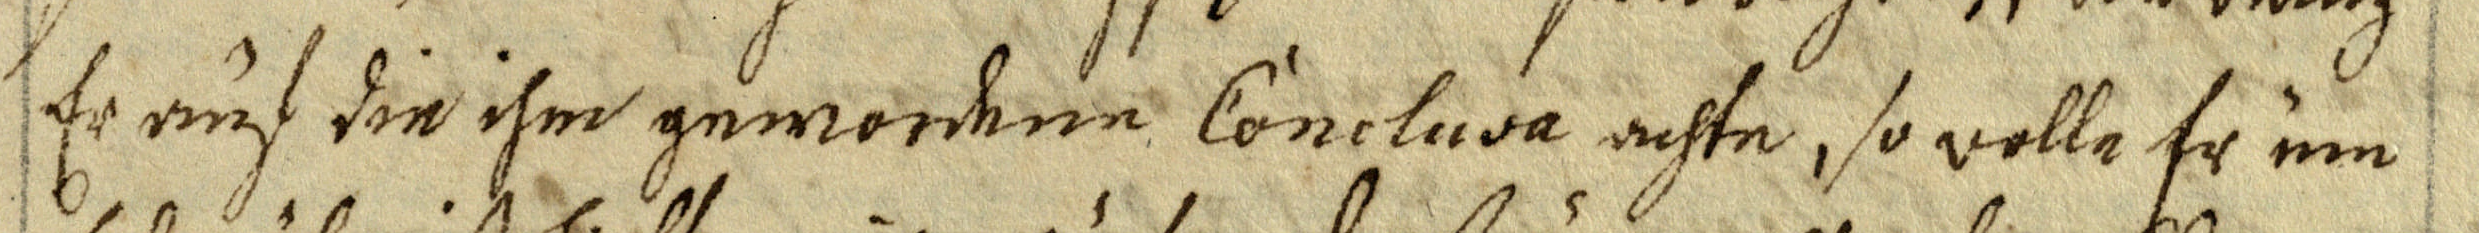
Er auf die ihm gewordnene Conclusa achte, so wolle Er um
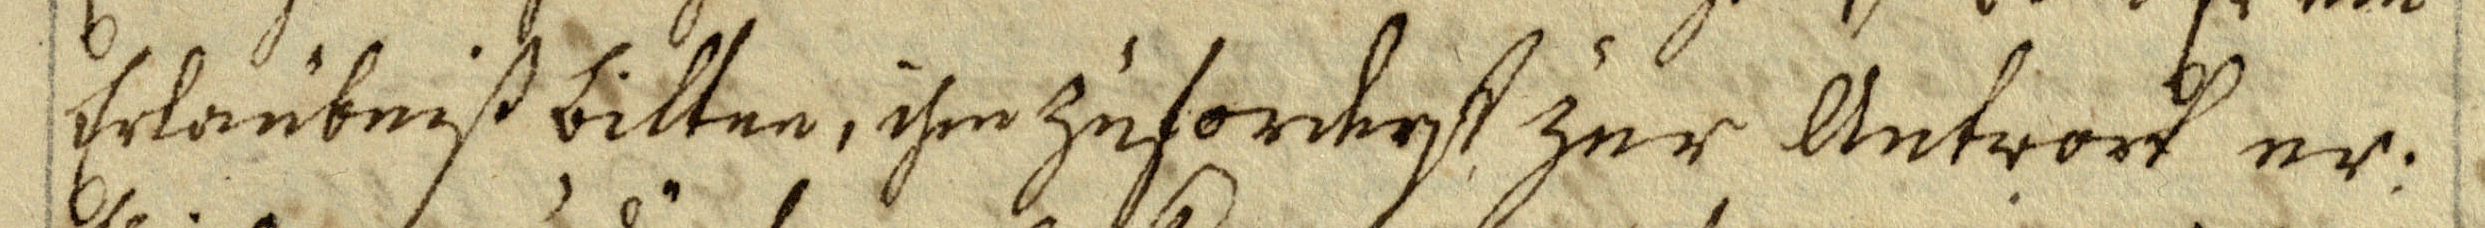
Erlaubniß bitten, ihm zuforderst zur Antwort er¬
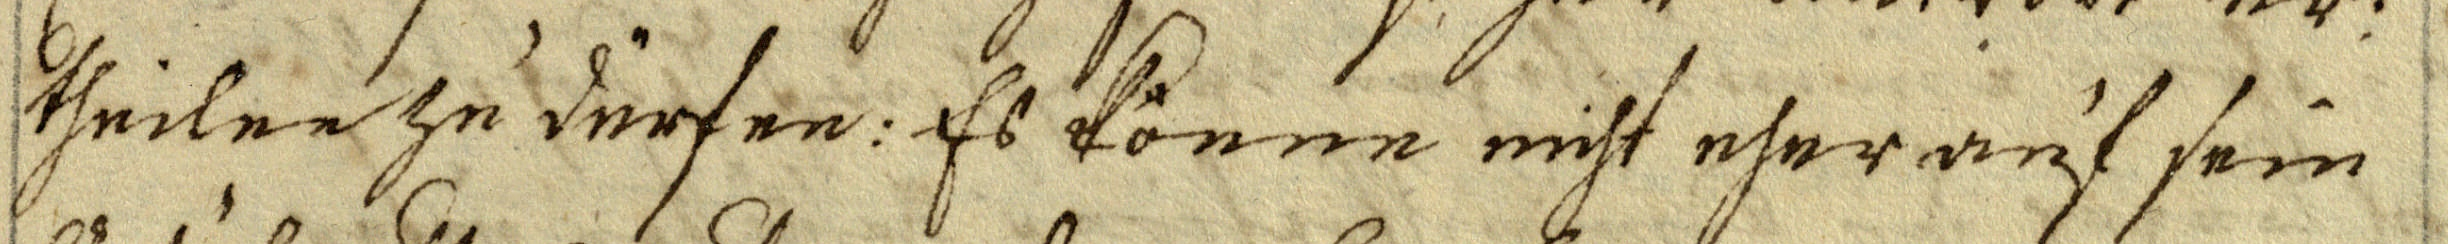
theilen zu dürfen: Es könne nicht eher auf sein
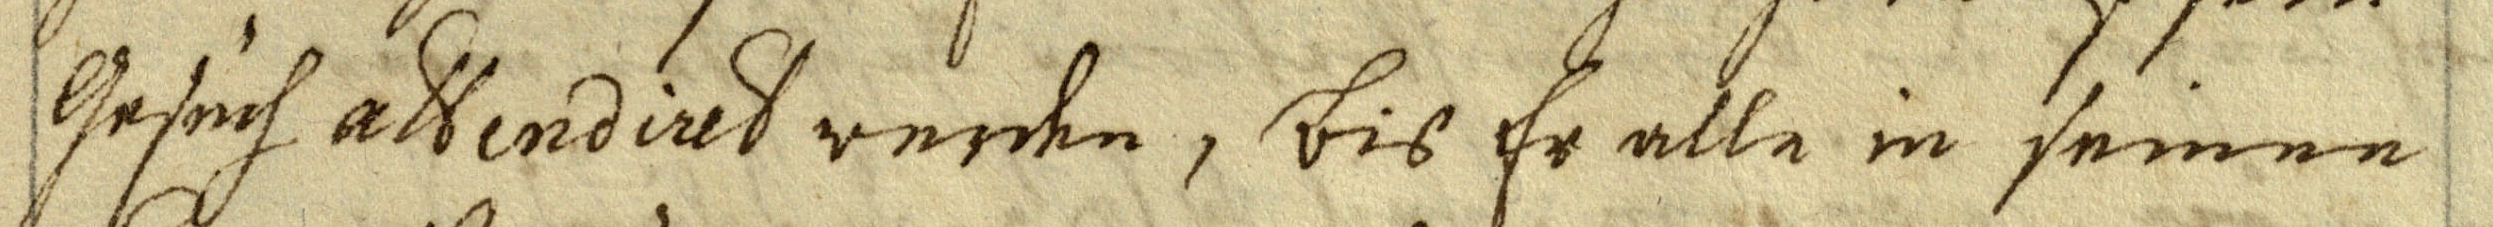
Gesuch attendiret werden, bis Er alle in seinen
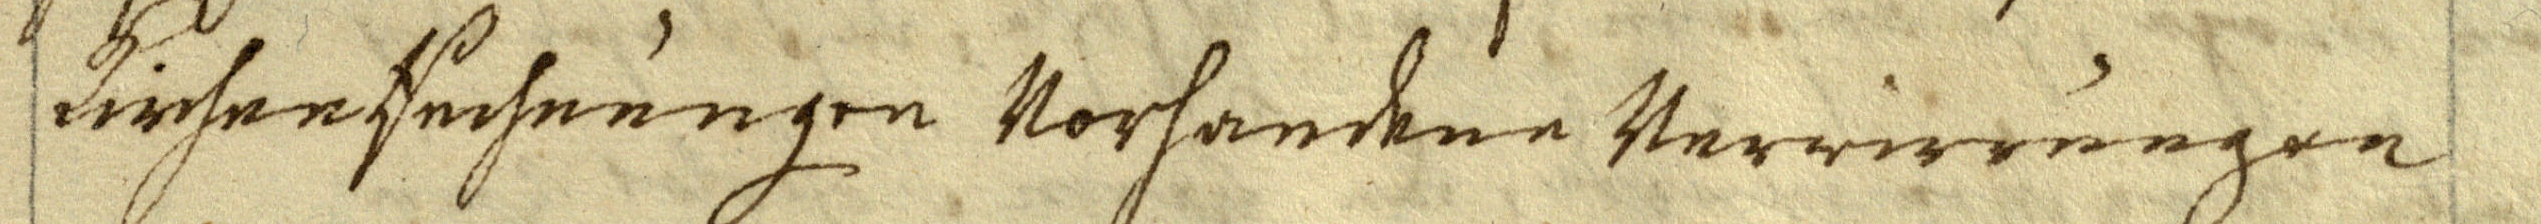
Kirchen Rechnungen vorhandene Verwirrungen
